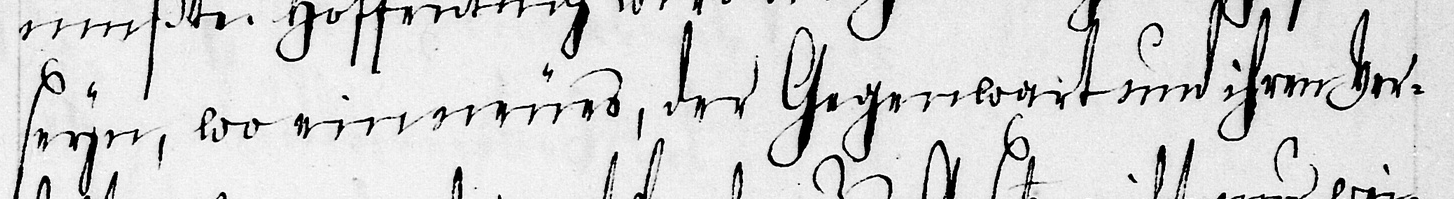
seyn, wo ein neues, der Gegenwart und ihren Ver¬
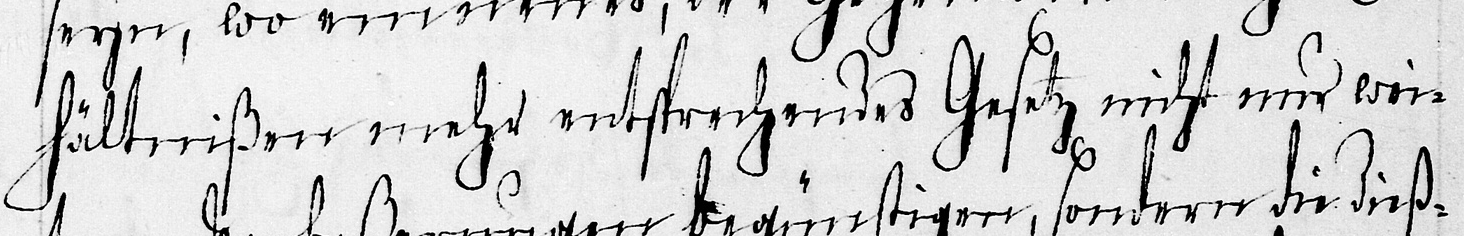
hältnißen mehr entsprechendes Gesetz nicht nur wei¬
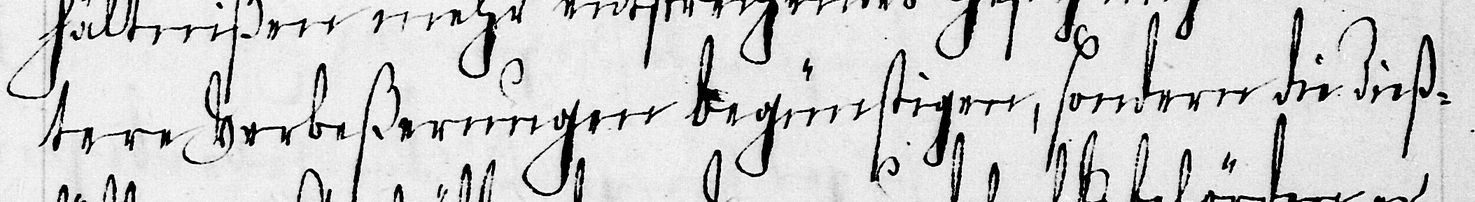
tere Verbeßerungen begünstigen, sondern die dieß¬
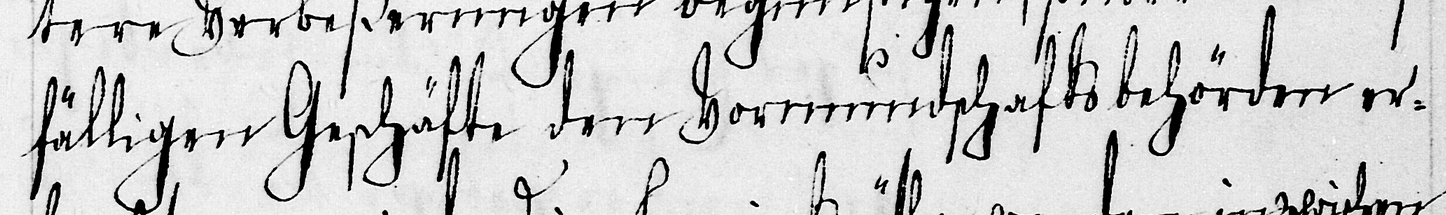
fälligen Geschäfte den Vormundschaftsbehörden er¬
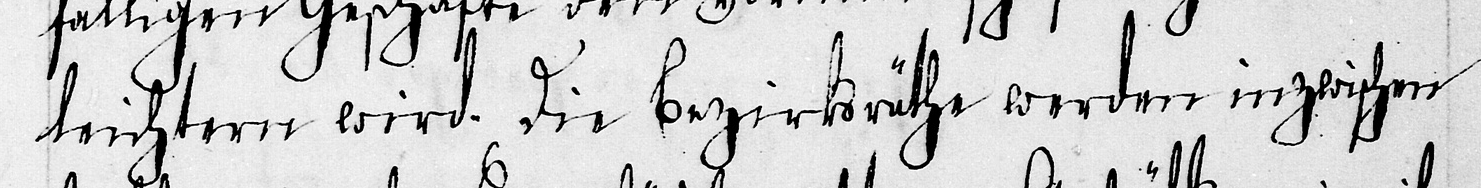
leichtern wird. Die Bezirksräthe werden inzwischen
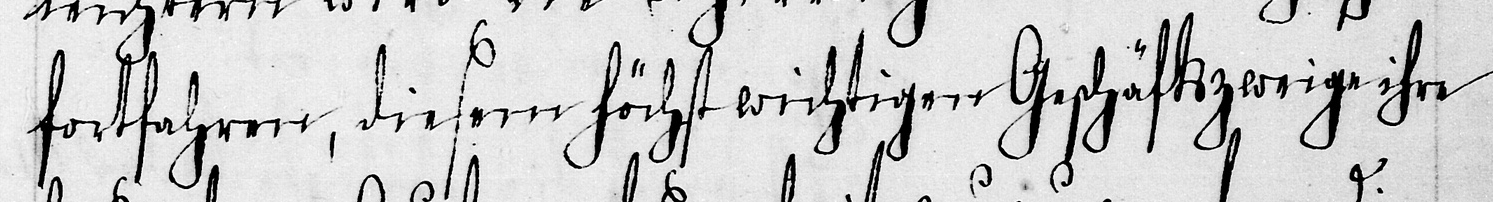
fortfahren, diesem höchst wichtigen Geschäftszweige ih¬
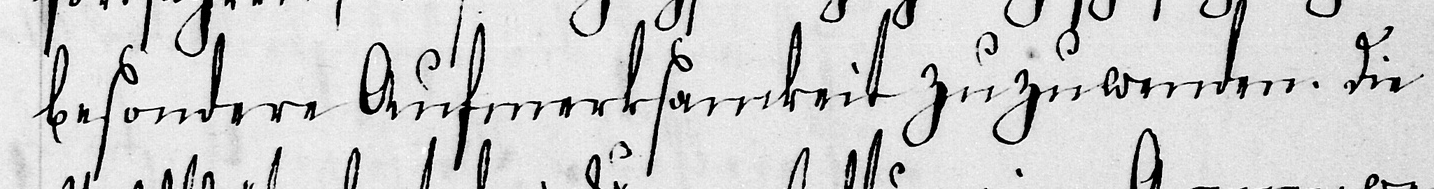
besondere Aufmerksamkeit zuzuwenden. Die
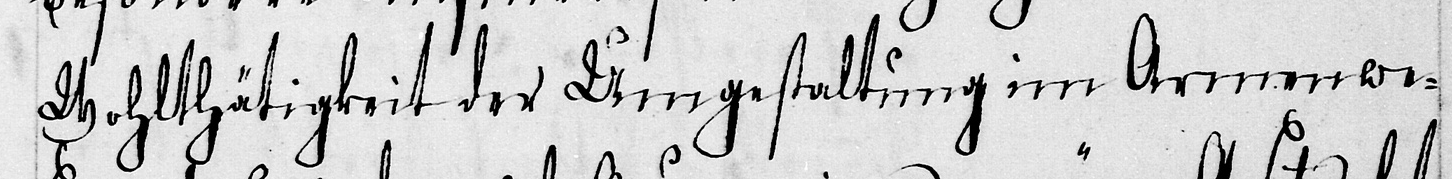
Wohlthätigkeit der Umgestaltung im Armenwe¬
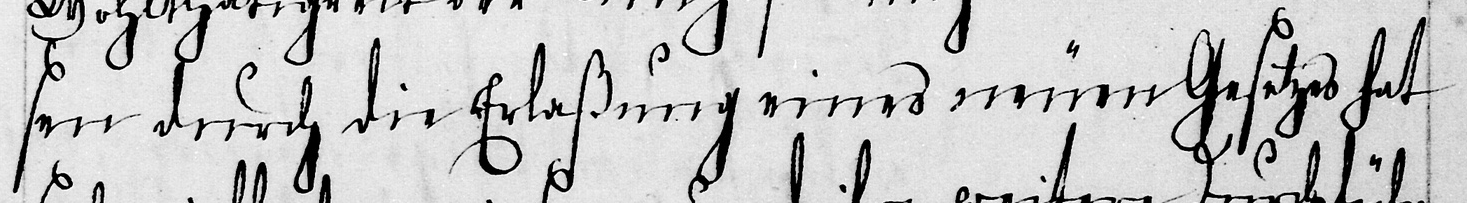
sen durch die Erlaßung eines neuen Gesetzes hat
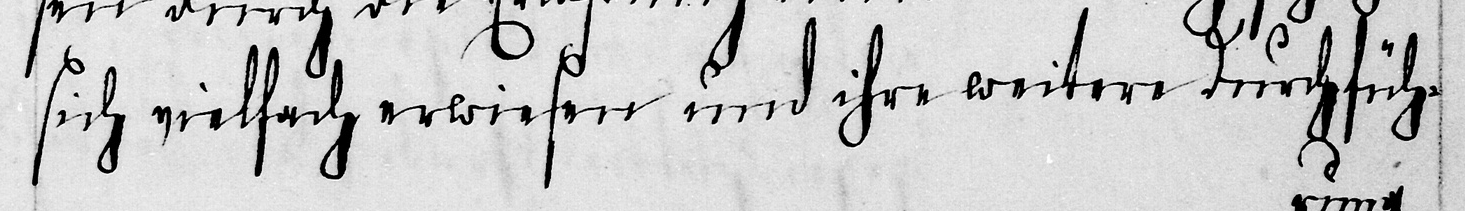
sich vielfach erwiesen und ihre weitere Durchfüh-
